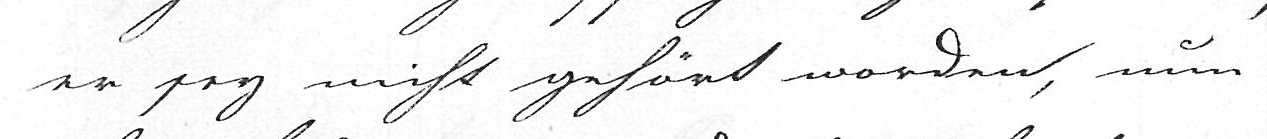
er sey nicht gehört worden, nun
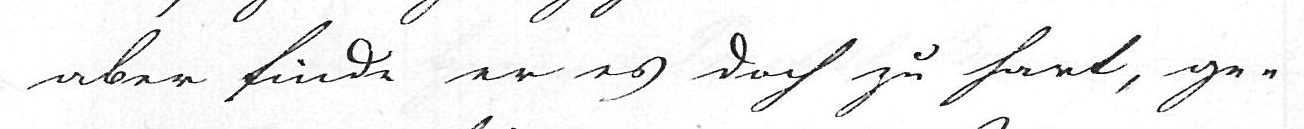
aber finde er es doch zu hart, ge-
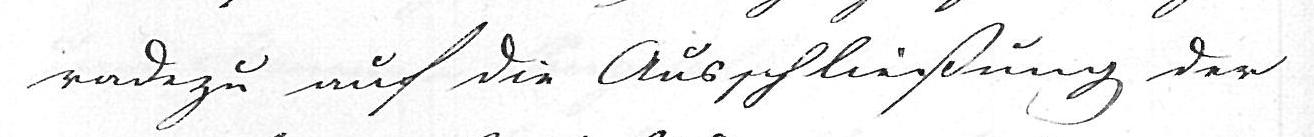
radezu auf die Ausschließung der
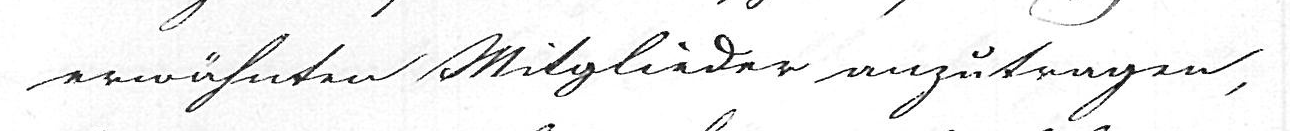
erwähnten Mitglieder anzutragen,
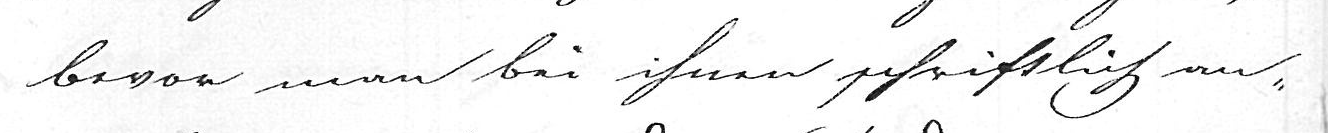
bevor man bei ihnen schriftlich an-
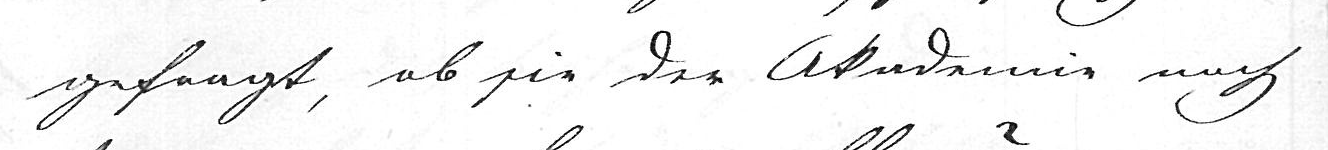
gefragt, ob sie der Akademie noch
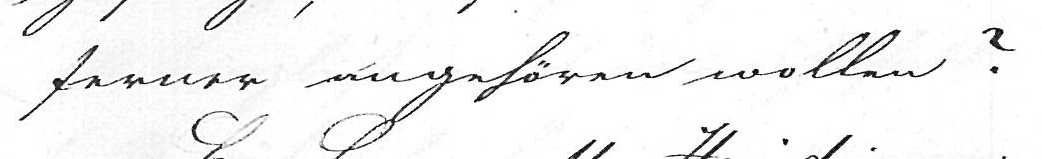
ferner gehören wollen?
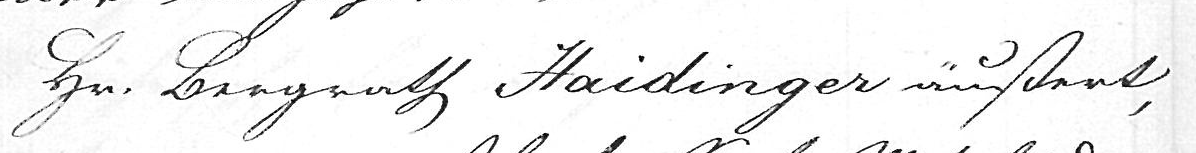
Hr. Bergrath Haidinger äußert,
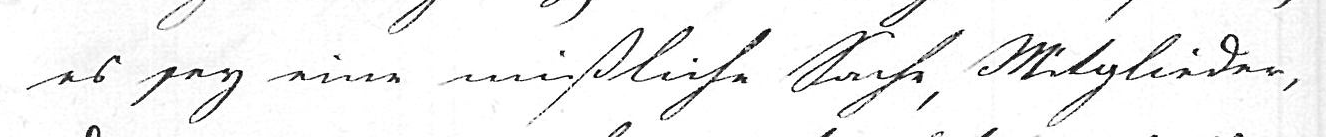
es sey eine mißliche Sache, Mitglieder,
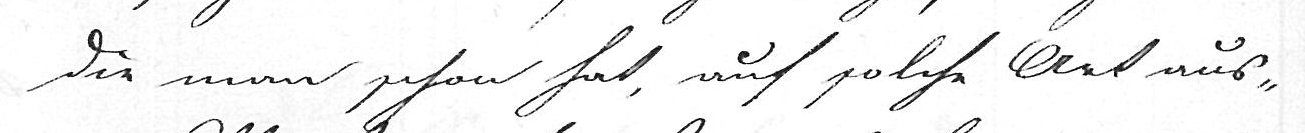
die man schon hat, auf solche Art aus-
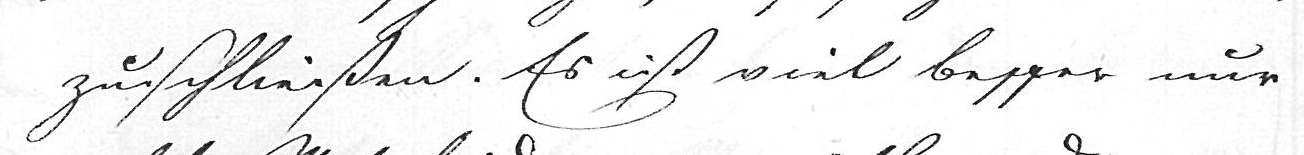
zuschließen. Es ist viel besser nur
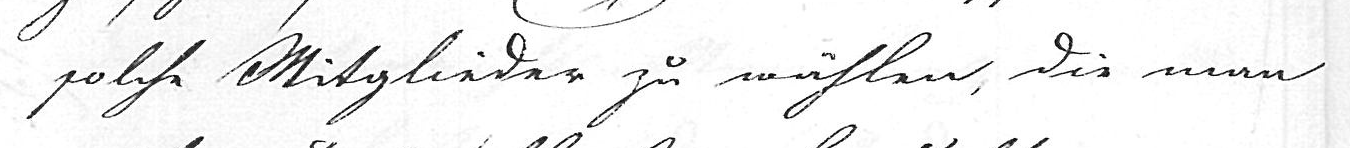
solche Mitglieder zu wählen, die man
